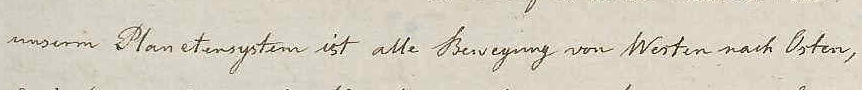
unserm Planetensystem ist alle Bewegung von Westen nach Osten,
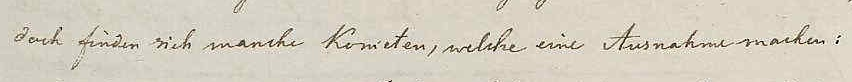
doch finden sich manche Kometen, welche eine Ausnahme machen:
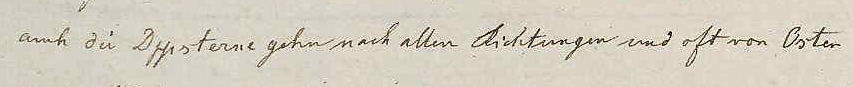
auch die Dppsterne gehn nach allen Richtungen und oft von Osten
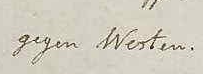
gegen Westen.
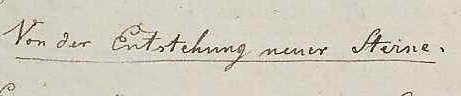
Von der Entstehung neuer Sterne.
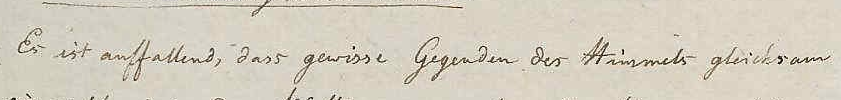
Es ist auffallend, dass gewisse Gegenden des Himmels gleichsam
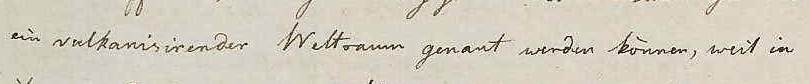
ein vulkanisirender Weltraum genant werden können, weil in
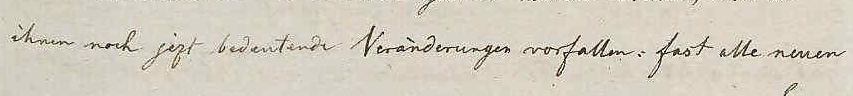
ihnen noch jezt bedeutende Veränderungen vorfallen: fast alle neuen
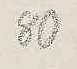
Sterne
